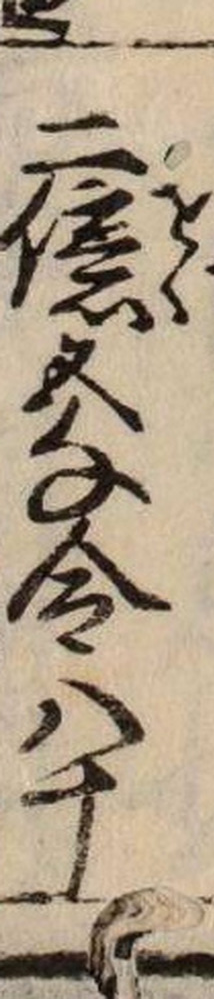[二億五千令八十]
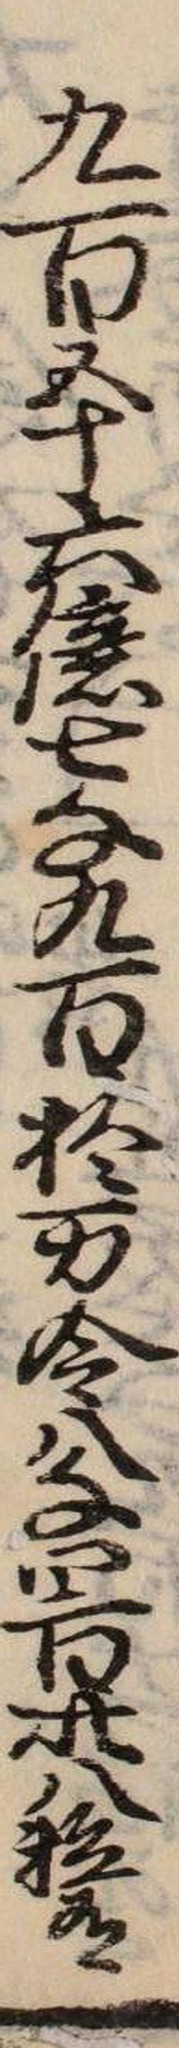九百五十六億七千九百拾万令八千四百廿八粒有
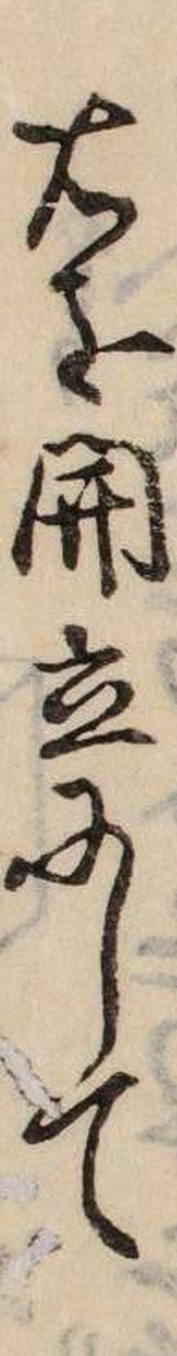右を開立にして
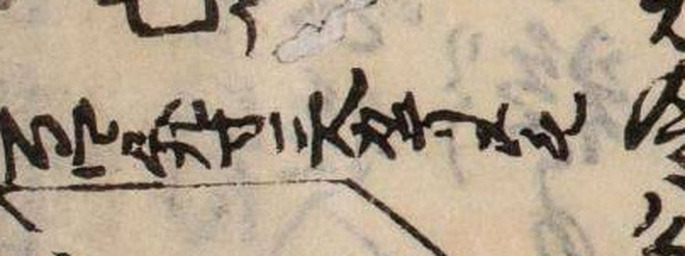壱間四尺九寸三分二り五毛

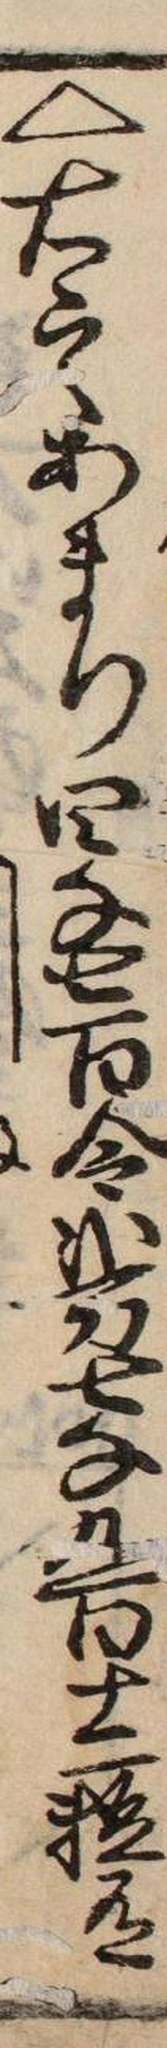△右之あまり四千七百令弐万七千九百十二粒有
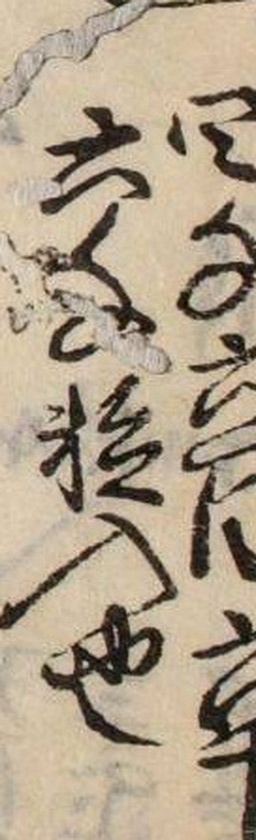六千粒入也
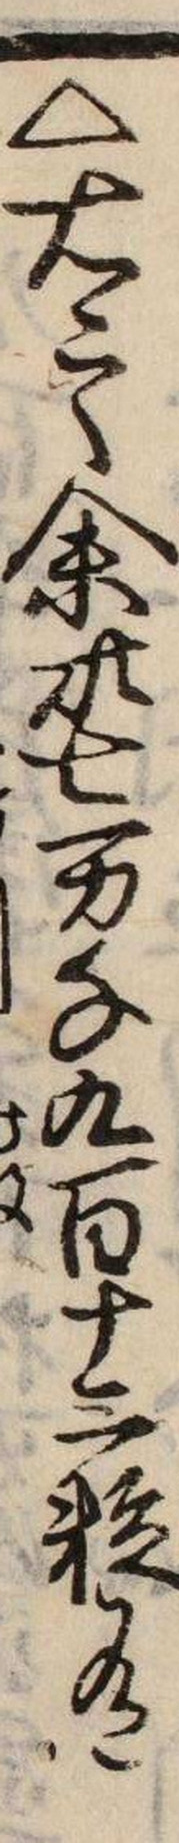△右之余卅七万千九百十二粒有
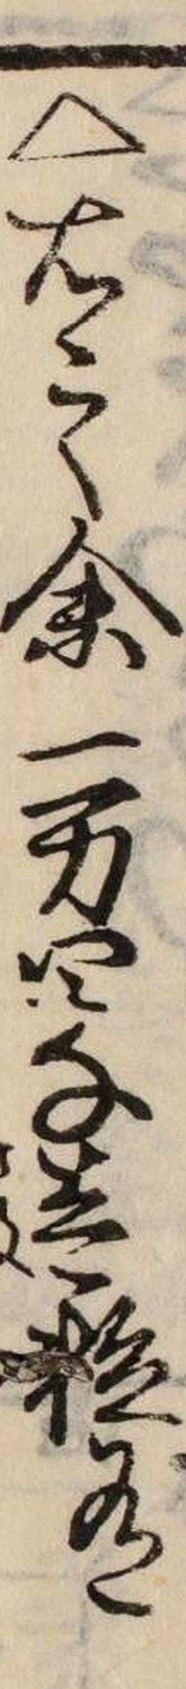△右之余一万四千壱粒有
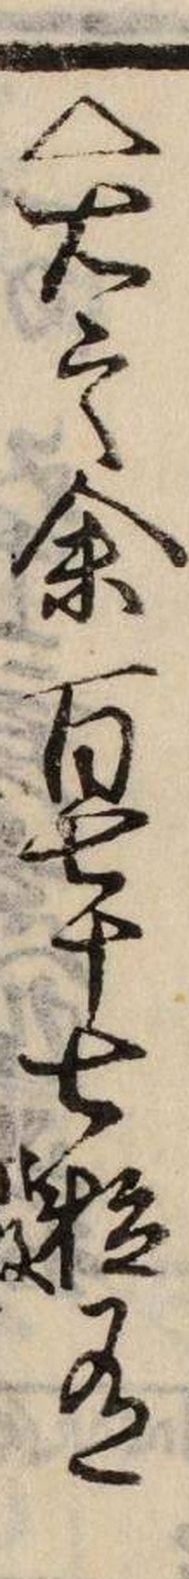△右之余百七十七粒有
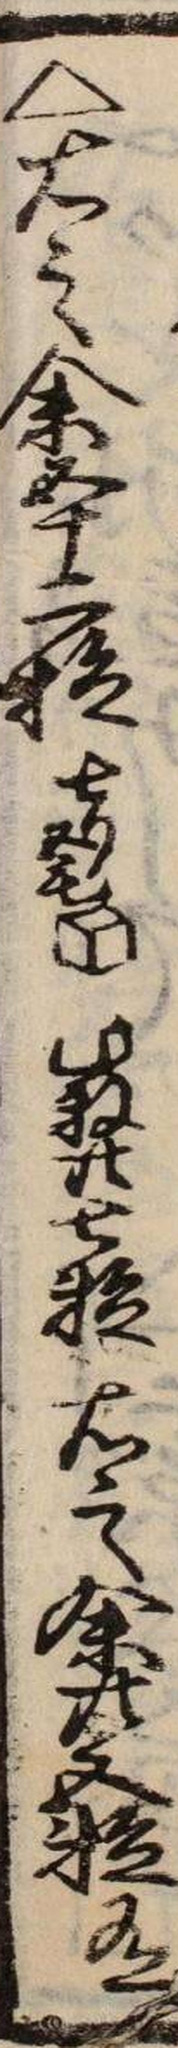△右之余五十二粒七り五毛此数廿七粒右之余廿五粒有
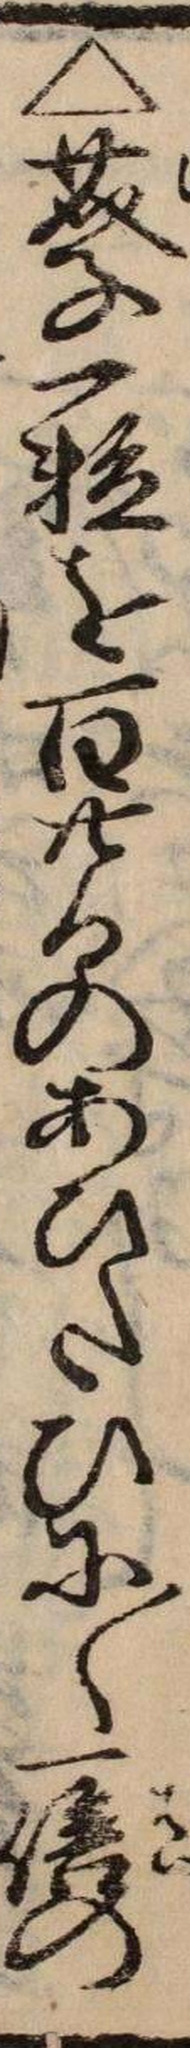△芥子一粒を百廿日のあひたひにひに一倍の
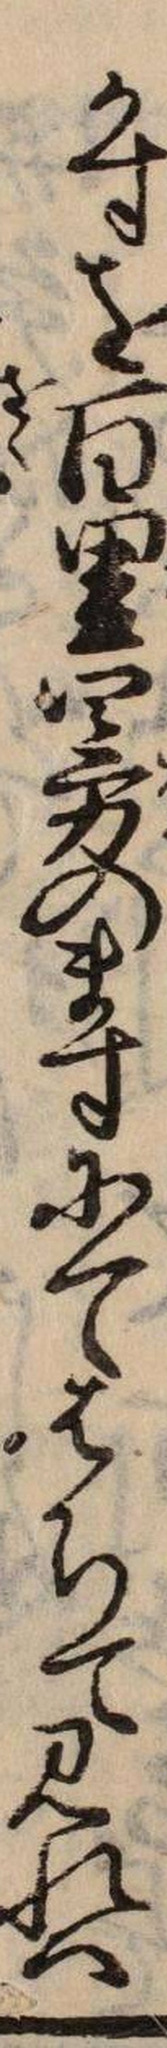かすを百里四方のますにてはちてみれは
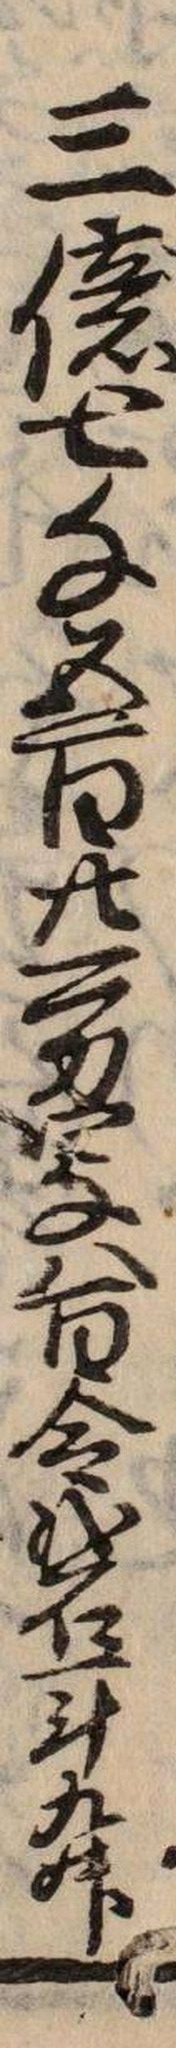三億七千五百廿一万四千八百令弐石一斗九升
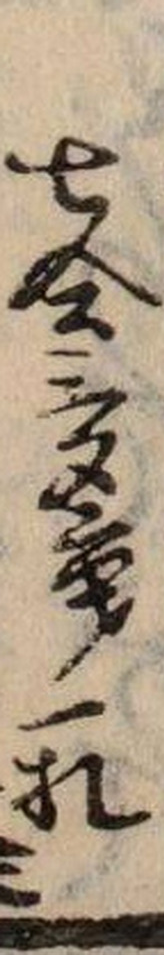七合三勺三才一撮
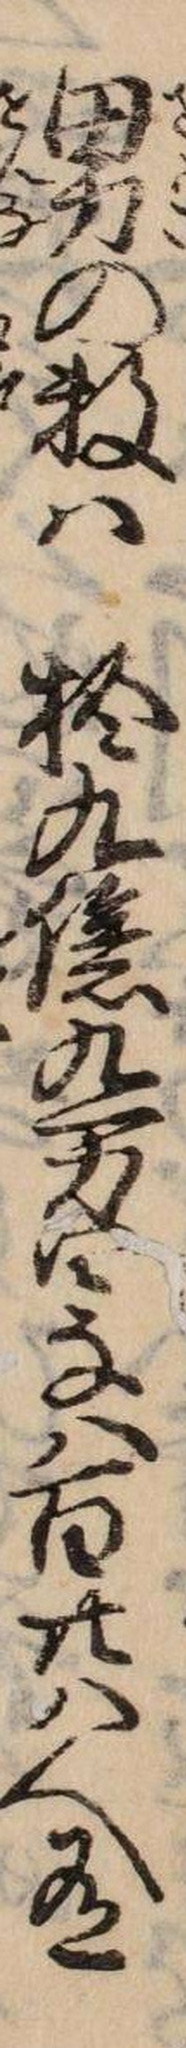男の数は拾九億九万四千八百廿八人有
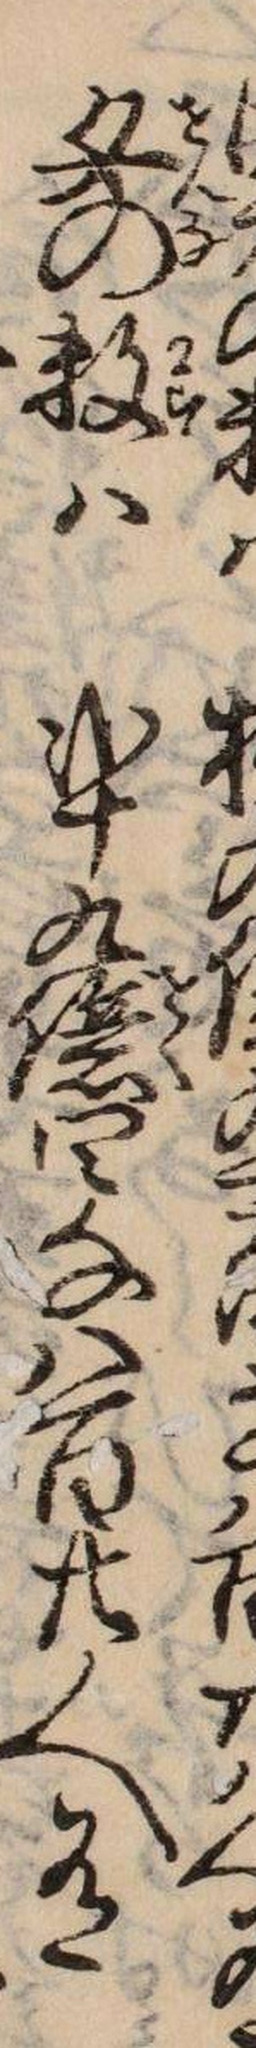女の数は弐十九億四千八百廿人有
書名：塵劫記（寛永11年自跋、京都府立京都学・歴彩館追貴8）
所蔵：京都府立京都学・歴彩館 国文学研究資料館
